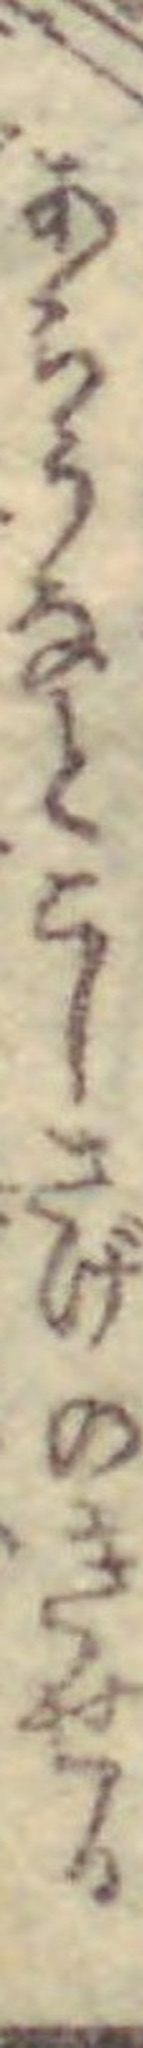あらうなとこしさげのきせる
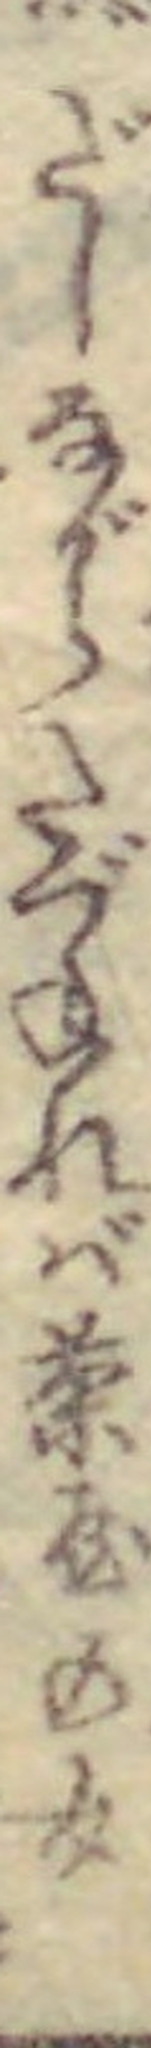だしながらたづぬれば茶屋の女
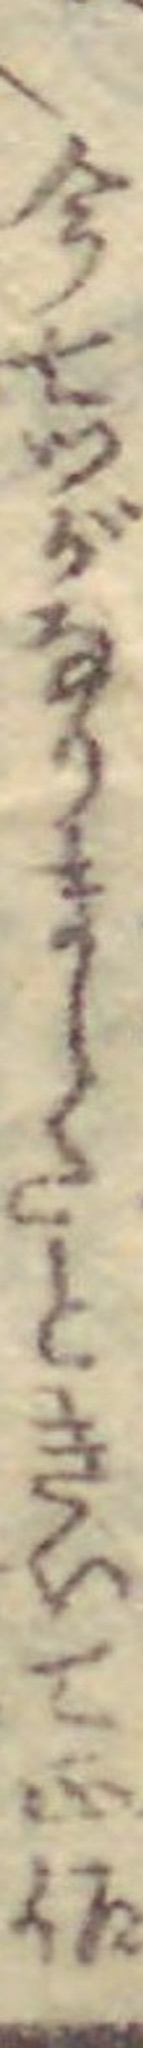今七ッがなりましたときいては正作
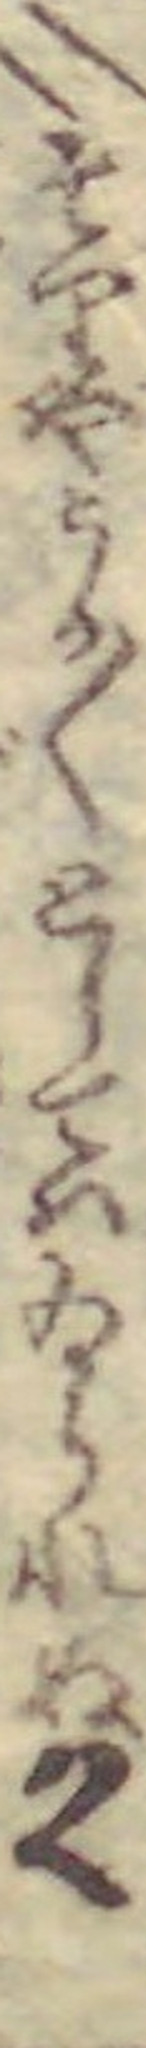そりやうか〳〵としてはゐられぬかへ
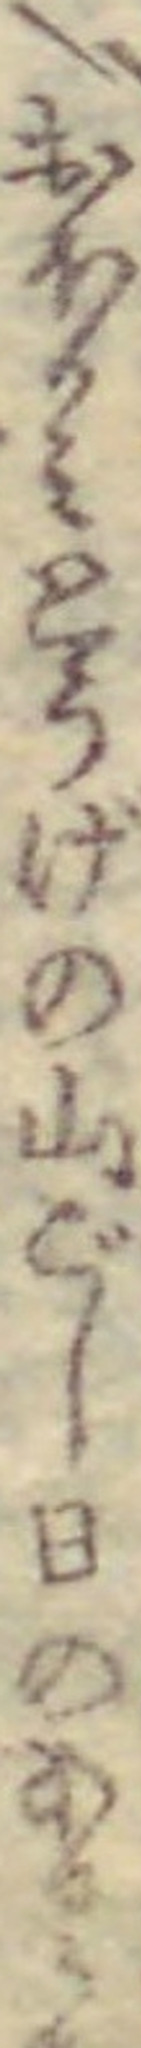おほかみとうげの山ごし日のあるうち
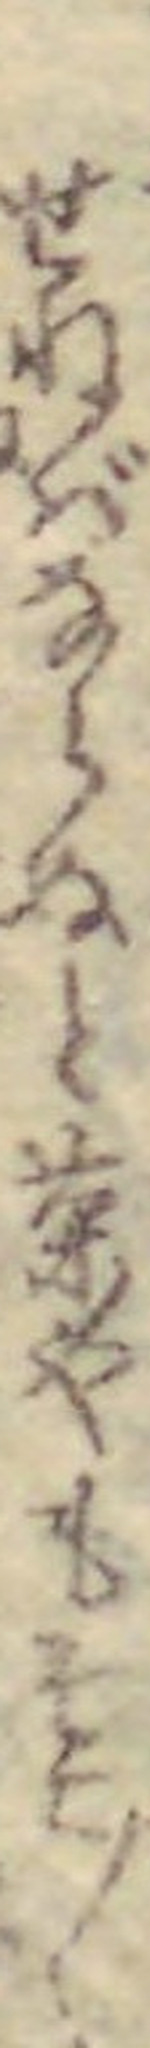せねばならぬと茶やもそこ〳〵
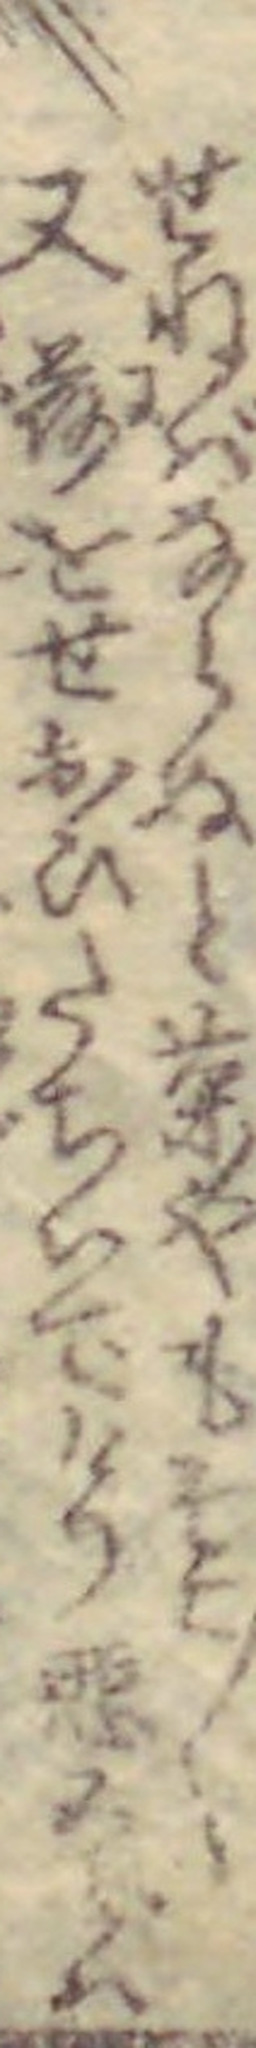又荷をせおひたちいでけり悪五郎は
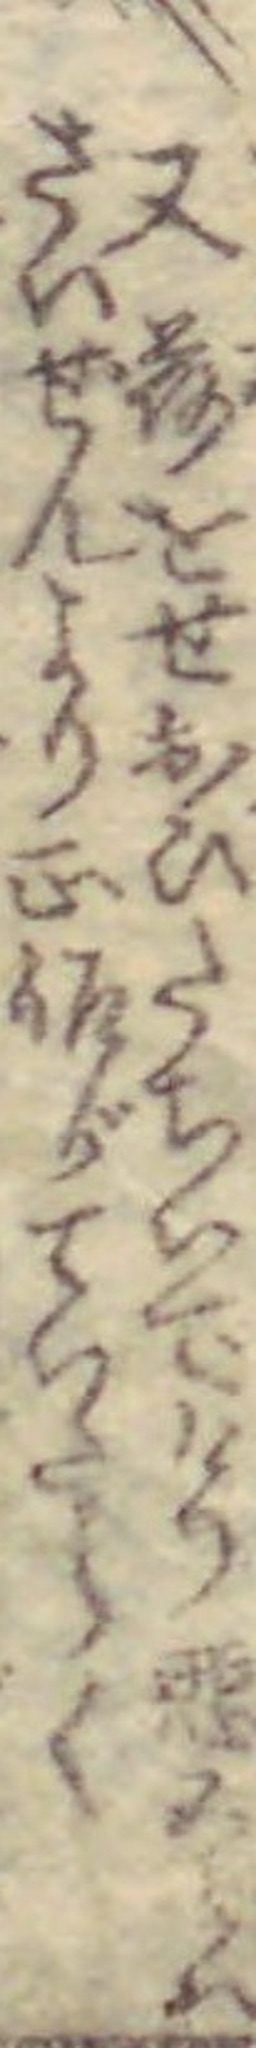さいぜんより正作がていたらく
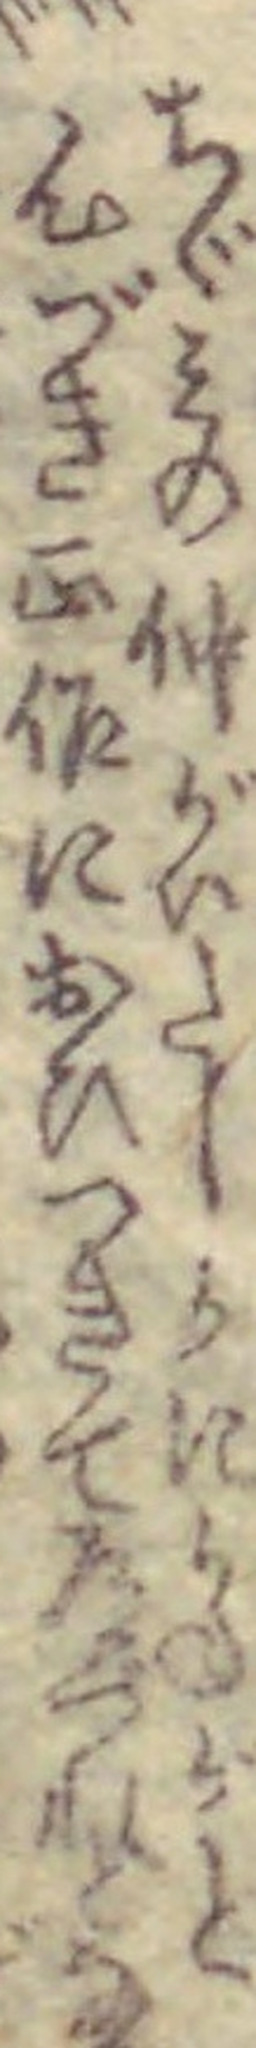心づき正作におひつきて道づれとなる
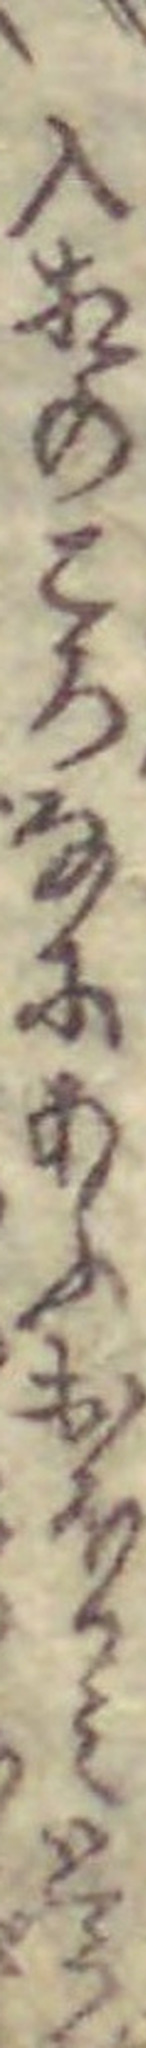入相のころなにあふおほかみとうげに
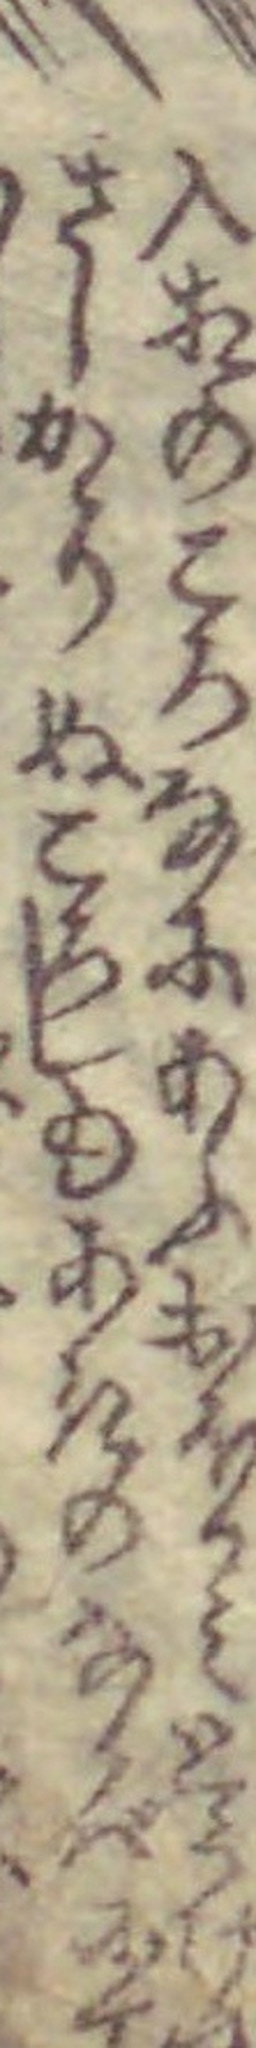さしかゝりぬころしもあきのなかばにて
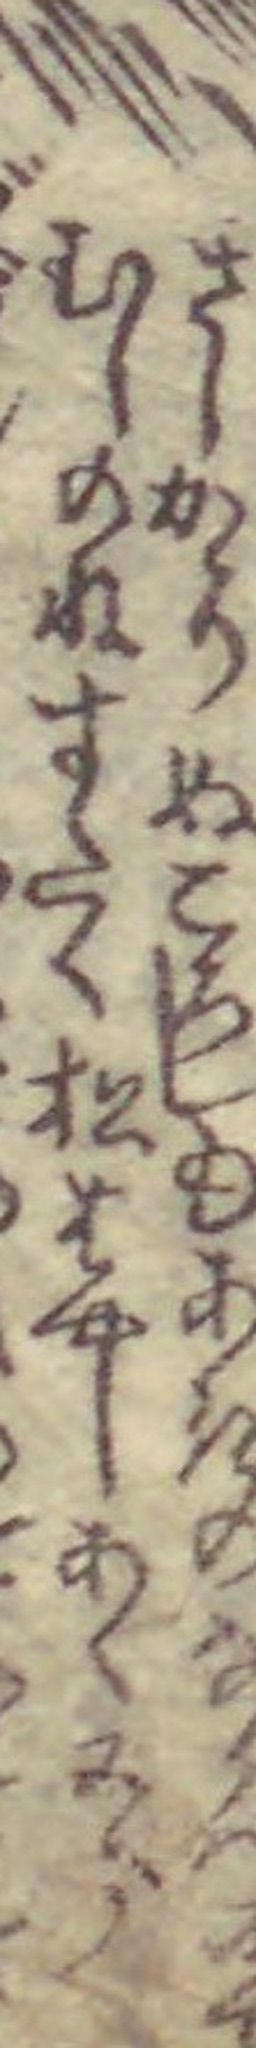むしのねすたく松は中あく五郎
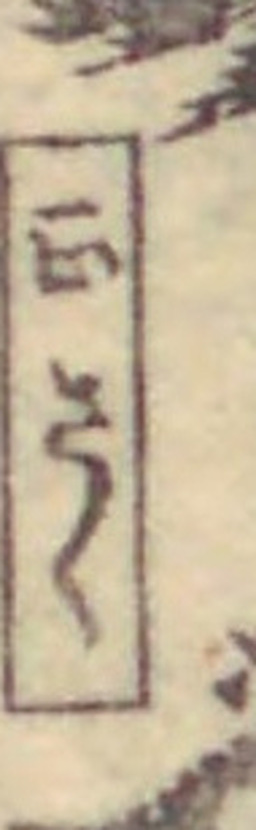正さく
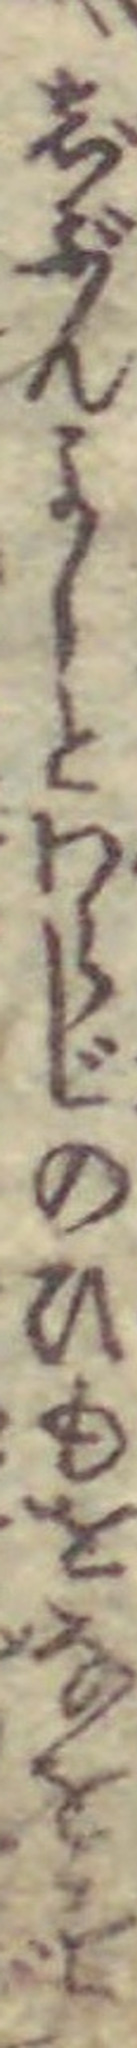じぶんよしとわらじのひもをなをす
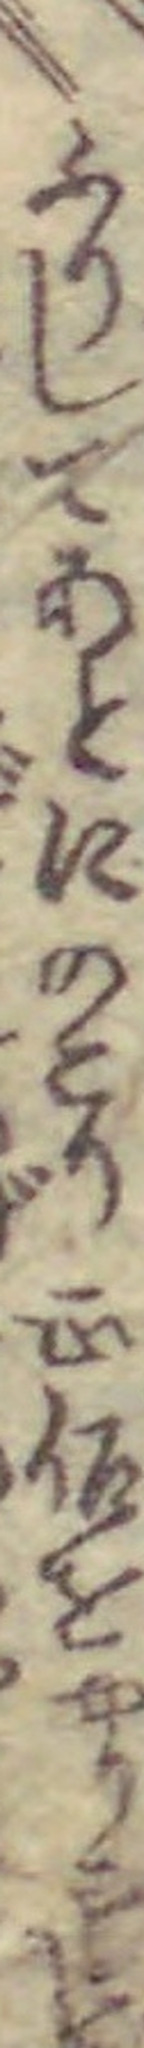ふりしてあとにのこり正作をやりすごし
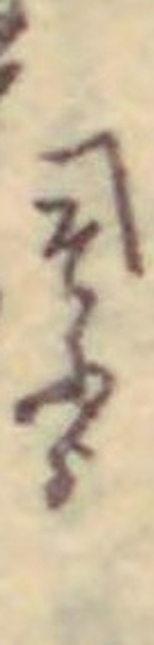〽そふは
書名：八ツ目鱣因縁物語 3巻
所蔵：国立国会図書館 National Diet Library, JAPAN
